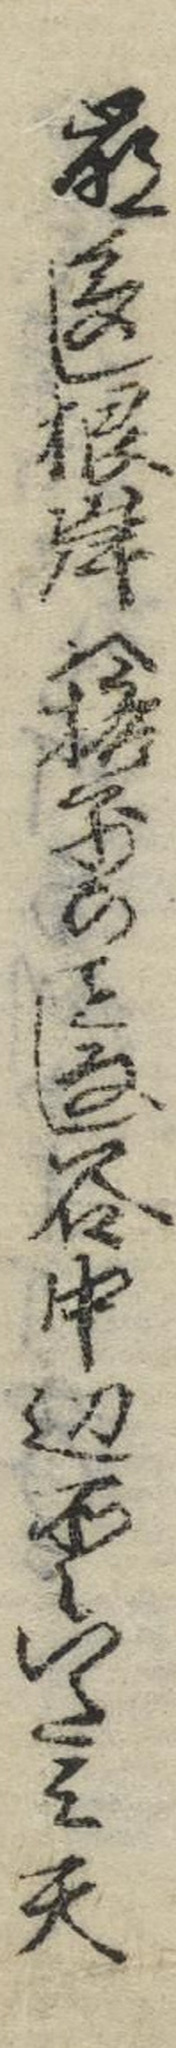崩多し根岸ハ格別のことなし谷中辺所〻いたミ天
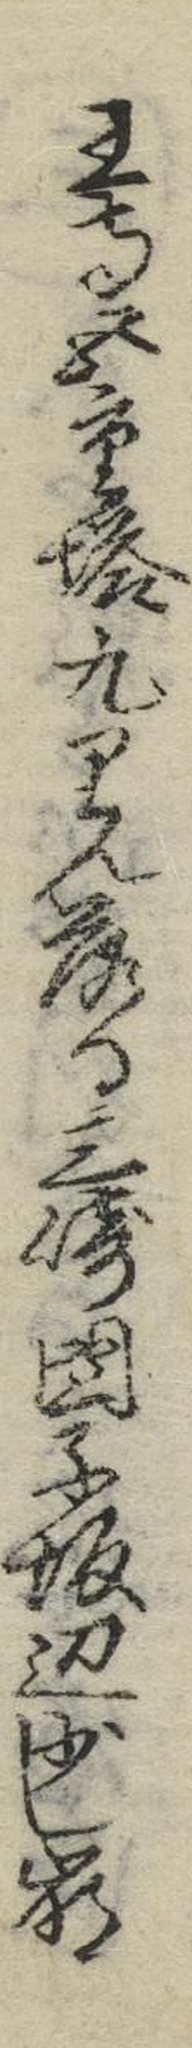王寺五重塔九りん落る三崎団子坂辺少し崩
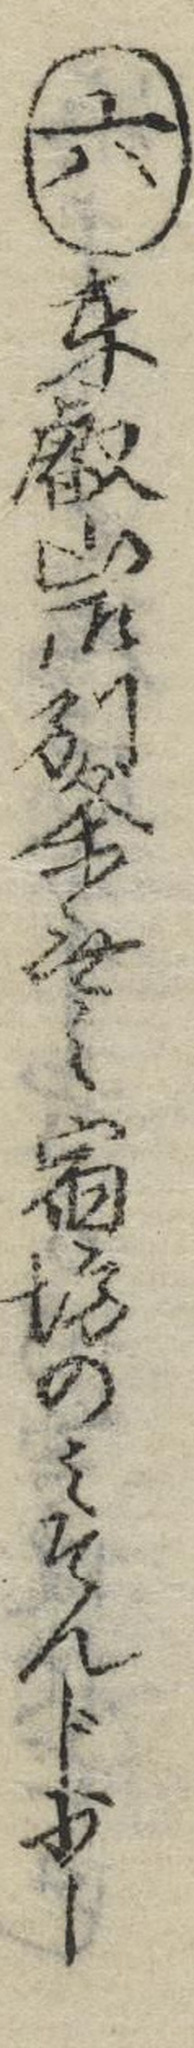六東叡山御別条無之宿坊のミそんじ少し
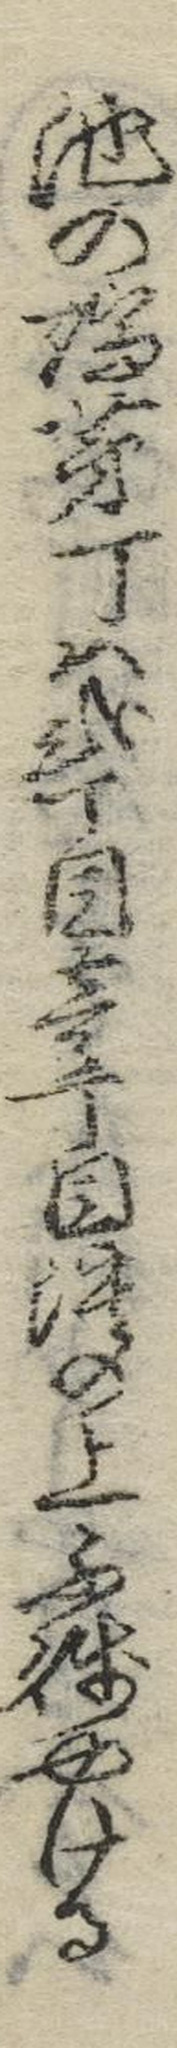池の端茅丁ハ弐丁目壱丁目潰の上不残やける
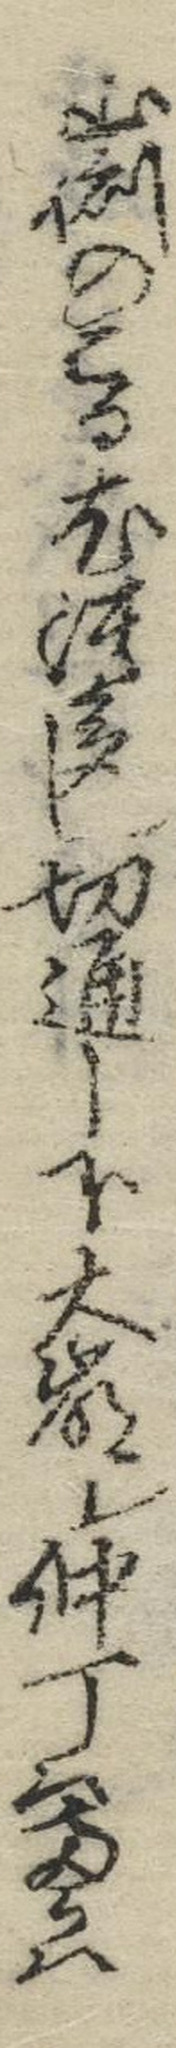山側のこる尤潰多し切通し下大崩レ仲丁富かハ
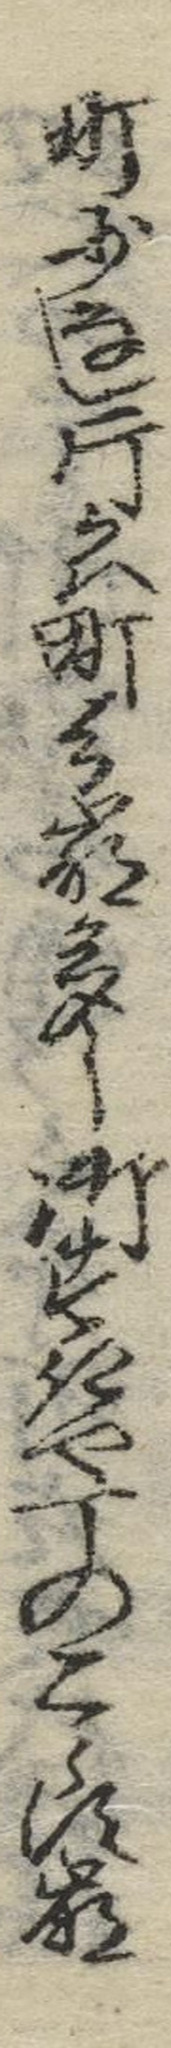町少なし片衣町は崩多し御すきや丁のこらす崩
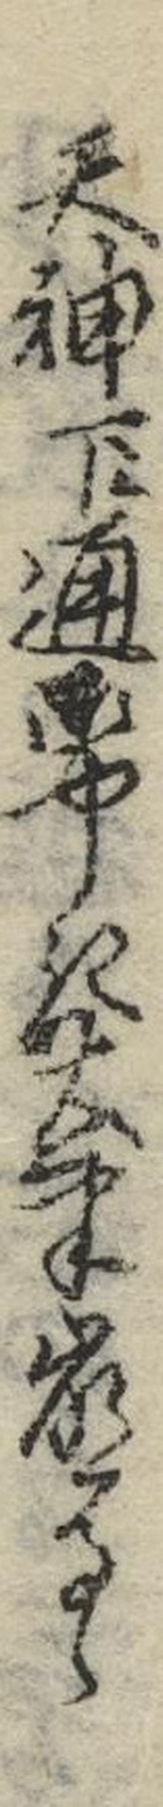天神下通り御中やしき大半崩るゝ
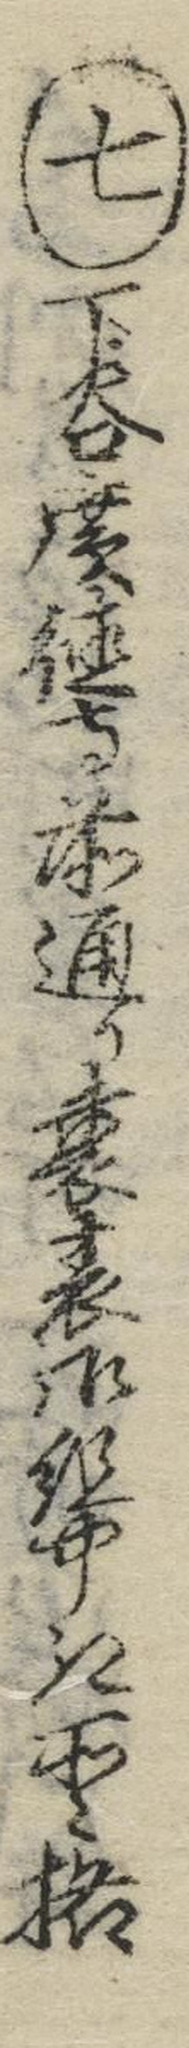七下谷廣徳寺前通り裏表御組やしき所〻格
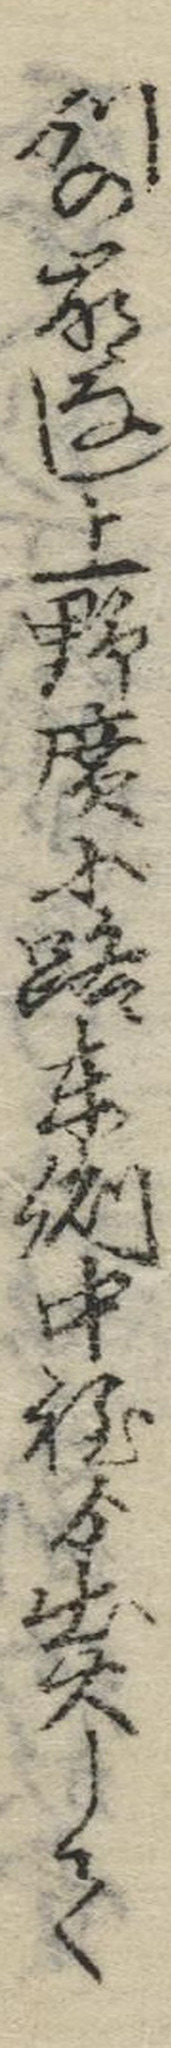別の崩なし上野広小路東側中程ゟ出火して
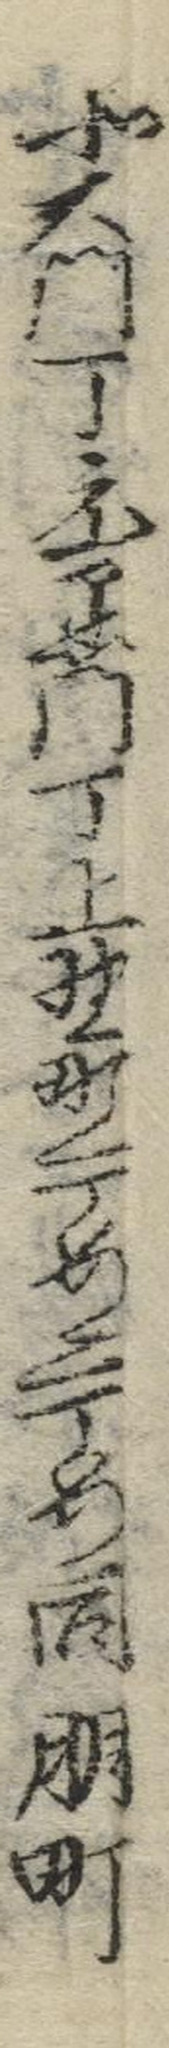北大門丁元黒門丁上野町一丁め二丁め同朋町
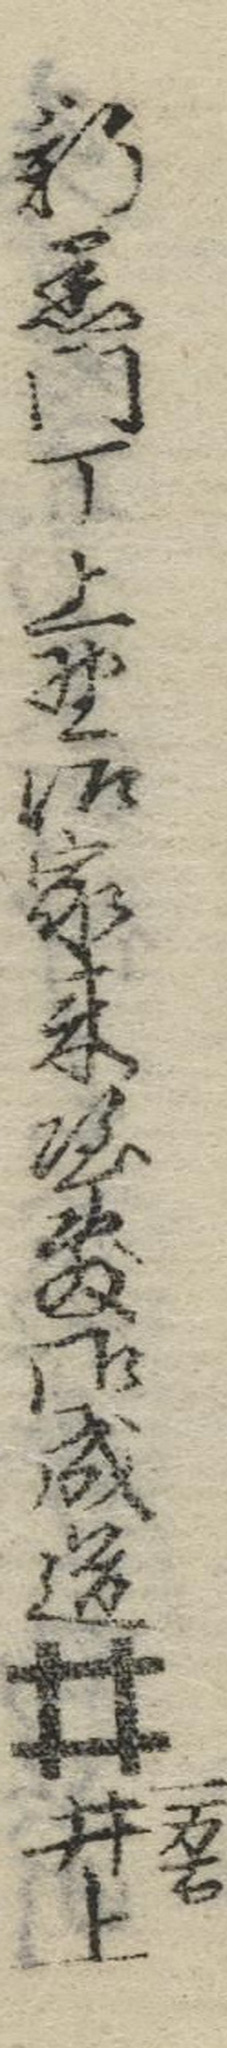新黒門丁上野御家来屋敷御成道井上
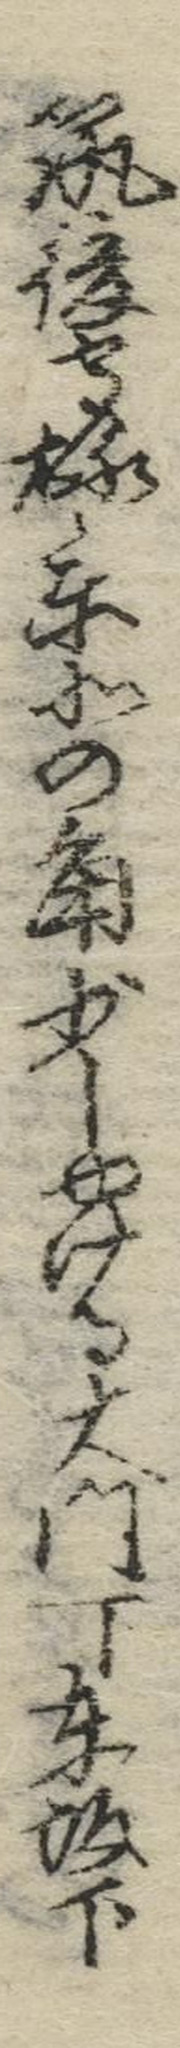筑後守様東北の角少しやける大門丁東坂下
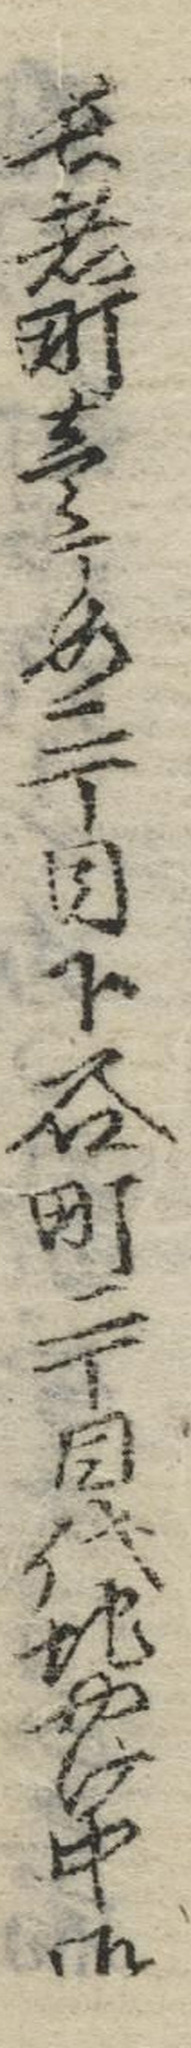長老町壱丁め二丁目下谷町二丁目代地やけ中御
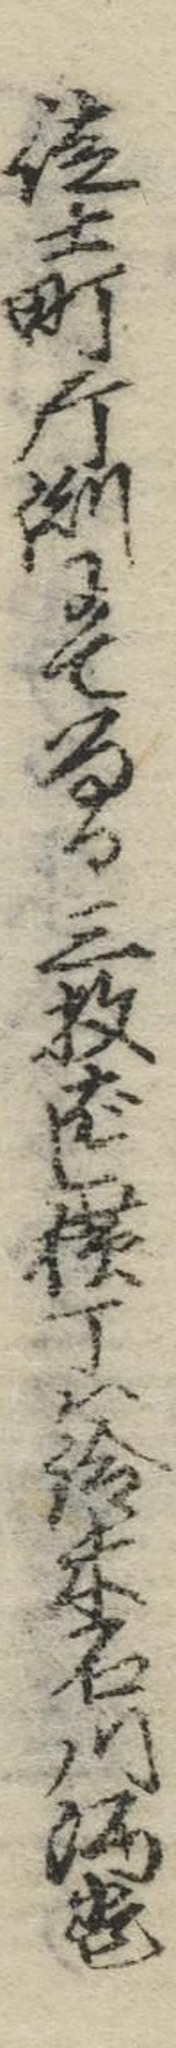徒士町片側にて留る三枚ばし横丁ハ鈴木石川酒巻
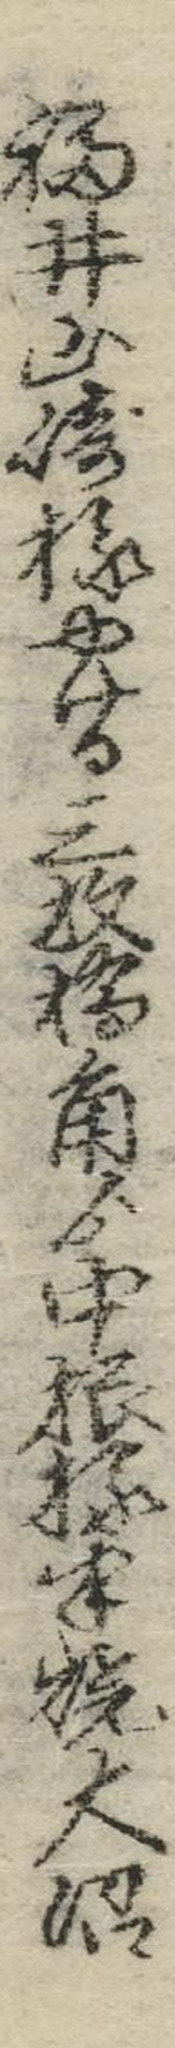福井山崎様やける三枚橋角ゟ中根様半焼大沼
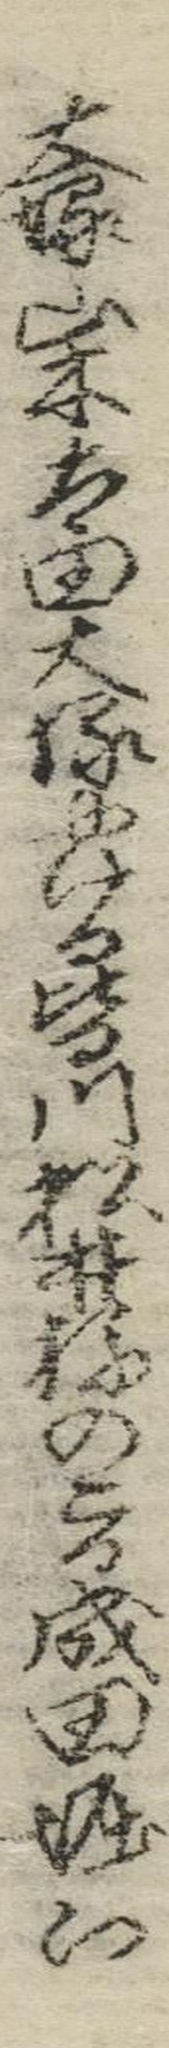大塚山木太田大塚やける皆川松井様のこる成田堀江
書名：江戸御屋鋪方町方共　地震類焼場所巨細書之寫　潰家潰土蔵共取調附街道筋近在迄
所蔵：東京大学地震研究所図書室 Earthquake Research Institute Library, The University of Tokyo, JAPAN
